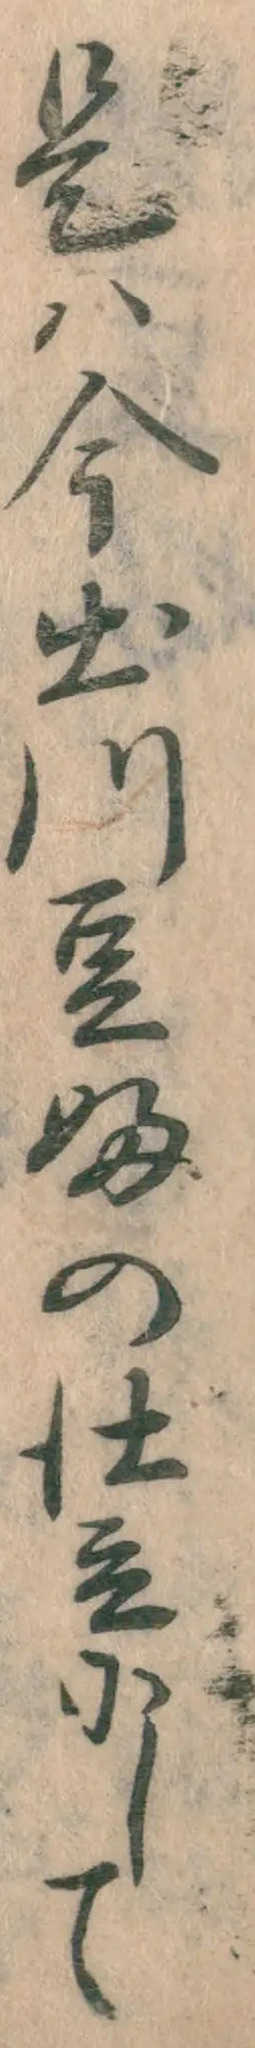是は今出川豆ふの仕立にして
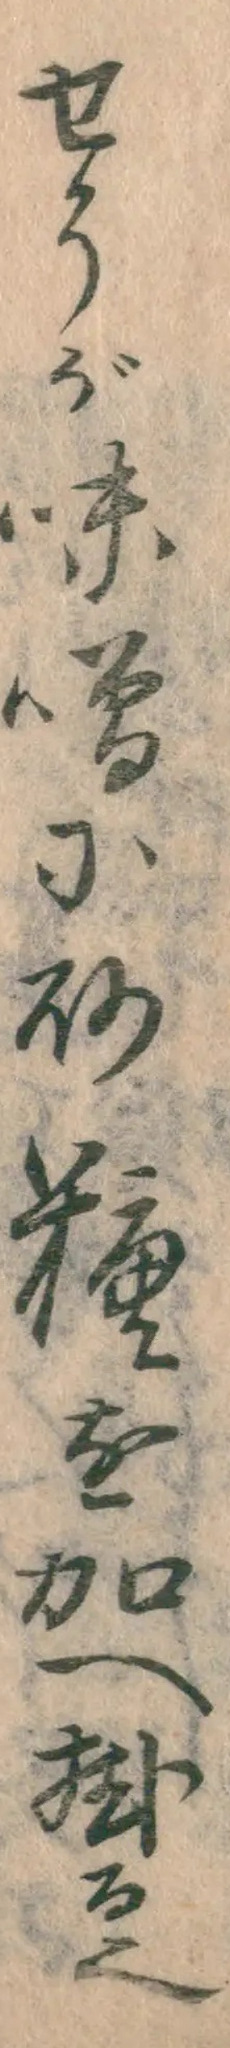せうが味噌に砂糖を加へ掛る也
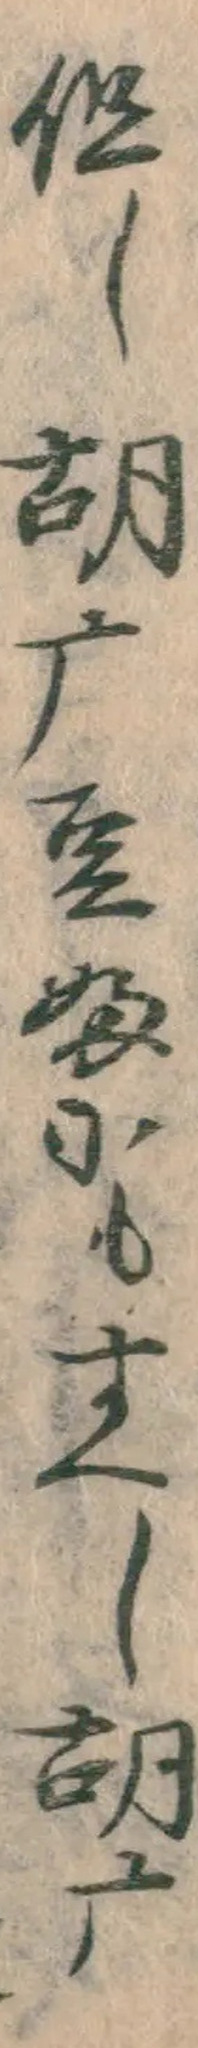但し胡麻豆ふにもすへし胡麻
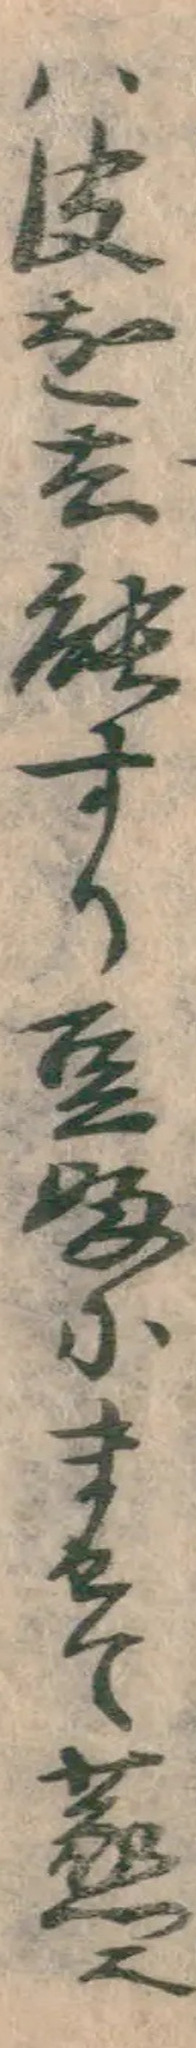は皮を去能すり豆ふにませて蒸也
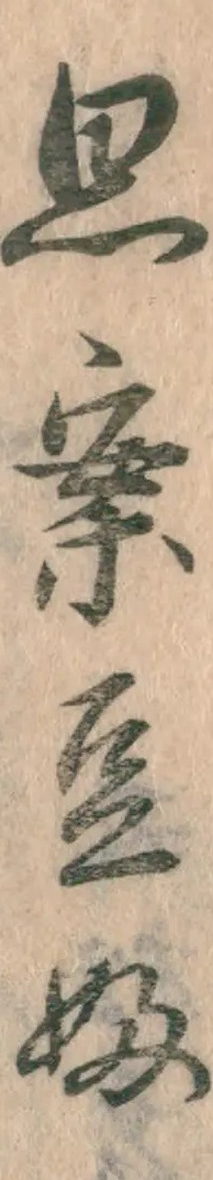思案豆ふ
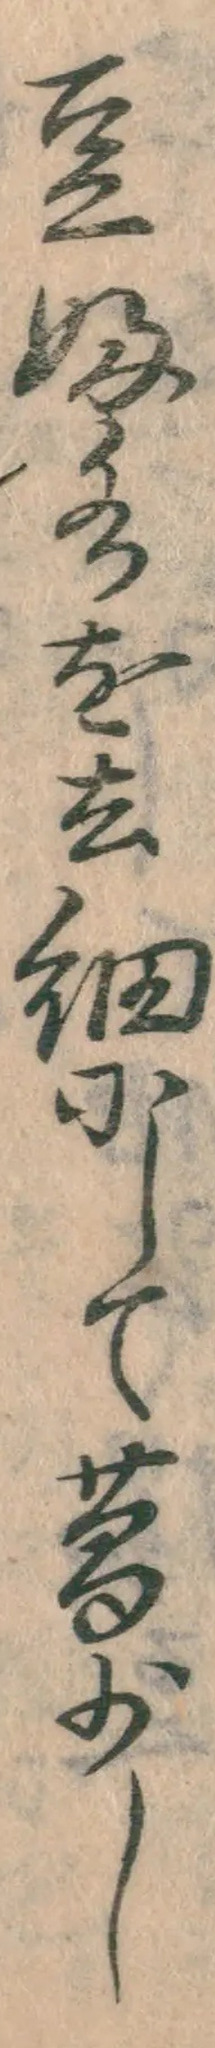豆ふ水を去細にして葛少し
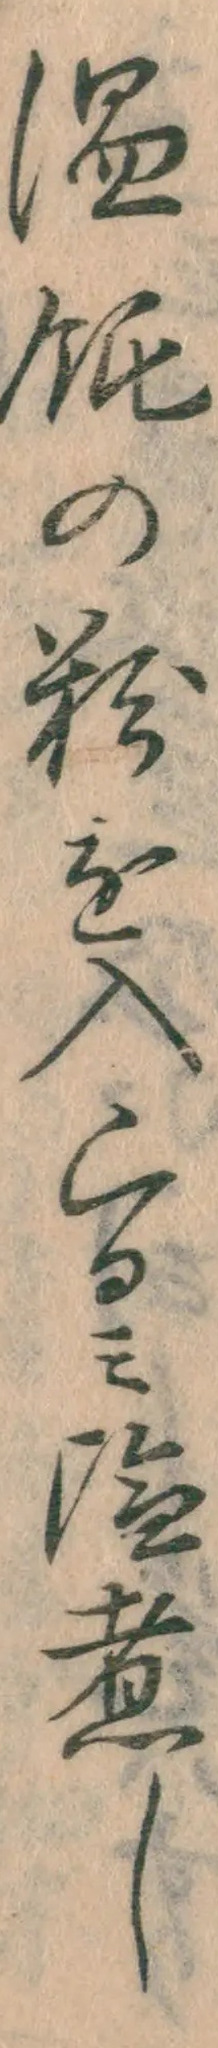温飩の粉を入くるみ塩煮し
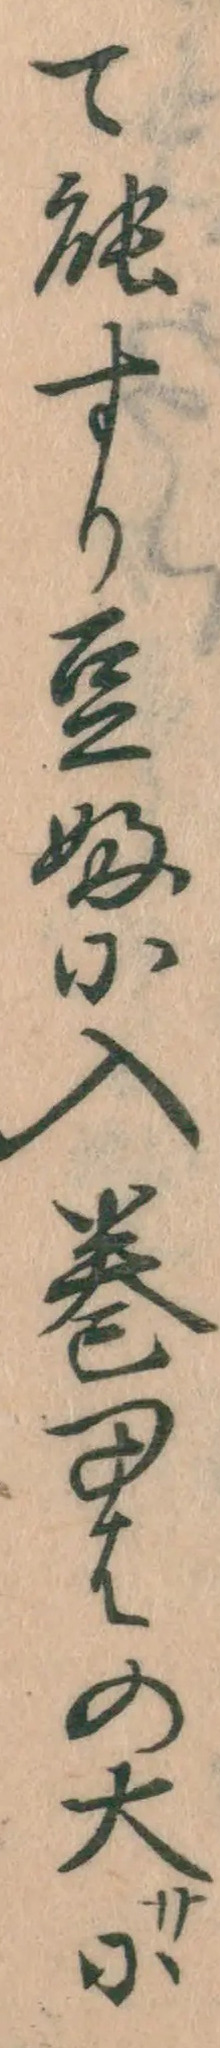て能すり豆ふに入巻ゆはの大さに
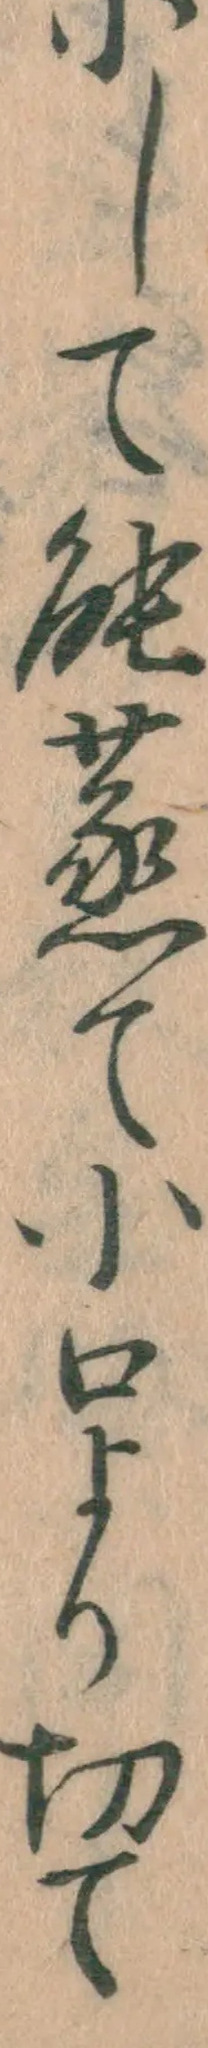にして能蒸て小口より切て
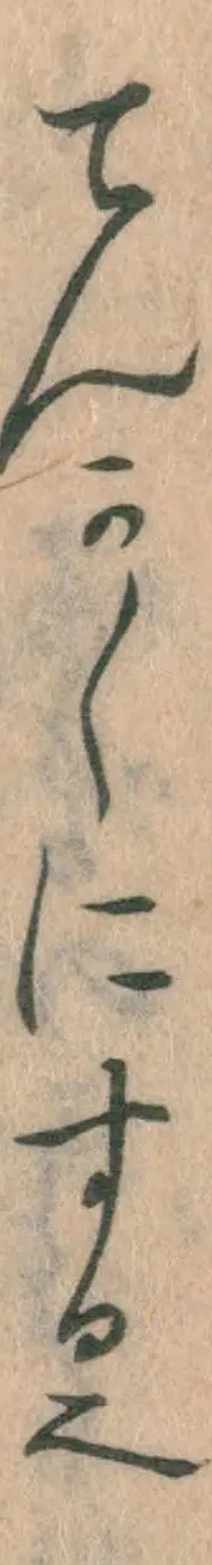てんかくにする也
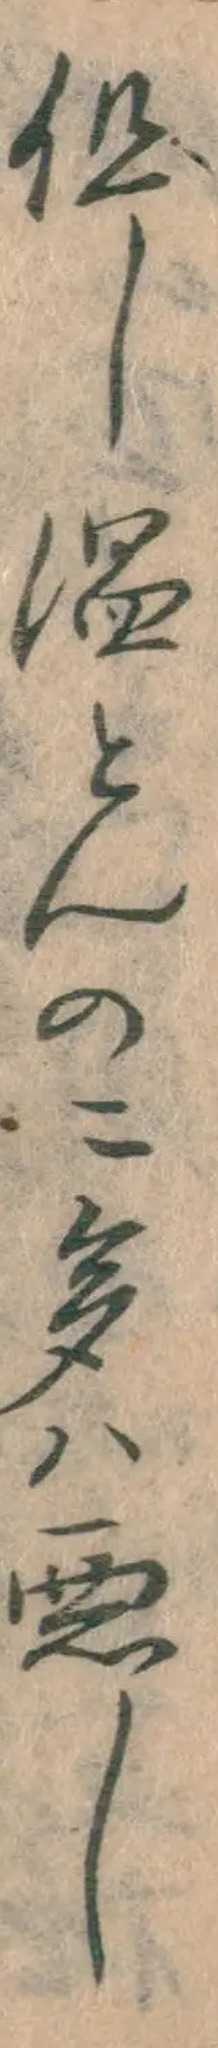但し温とんのこ多は悪し
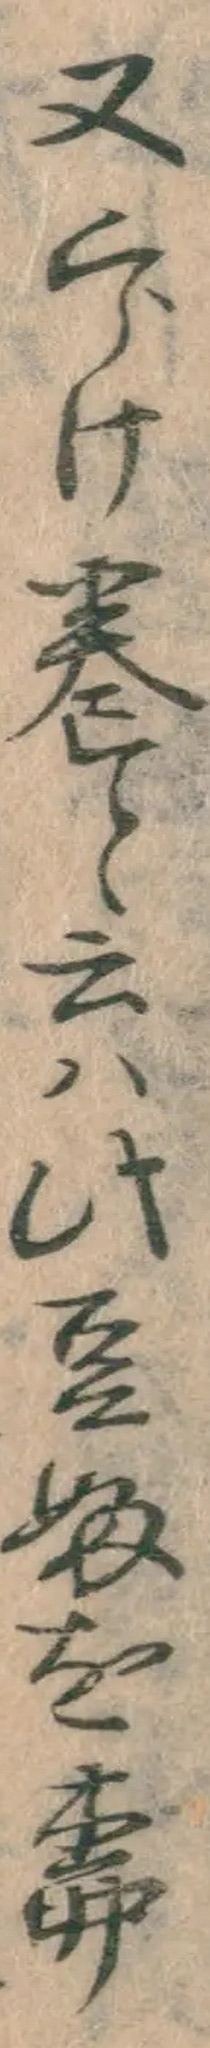又くらけ巻と云は此豆ふを柳
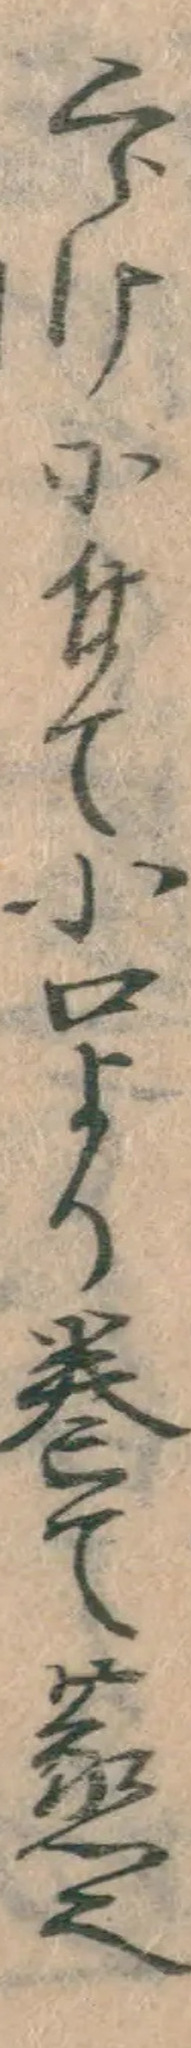くらけに付て小口より巻て蒸也
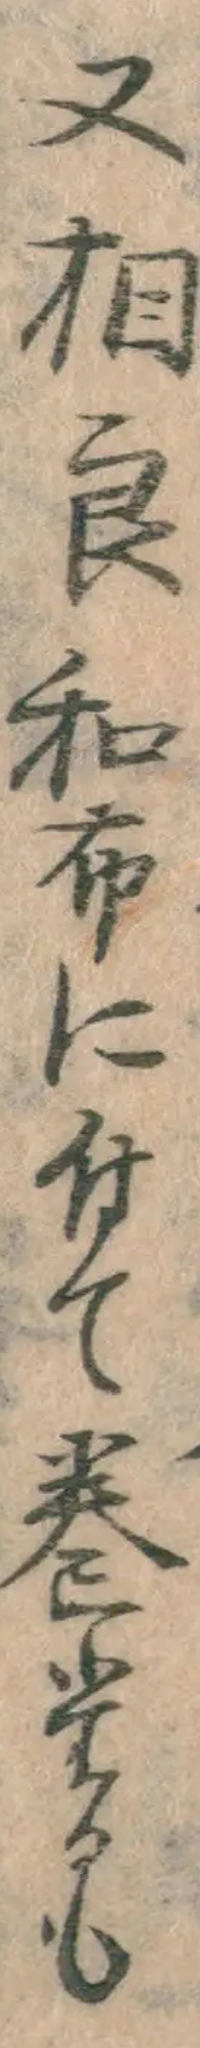又相良和布に付て巻たるも
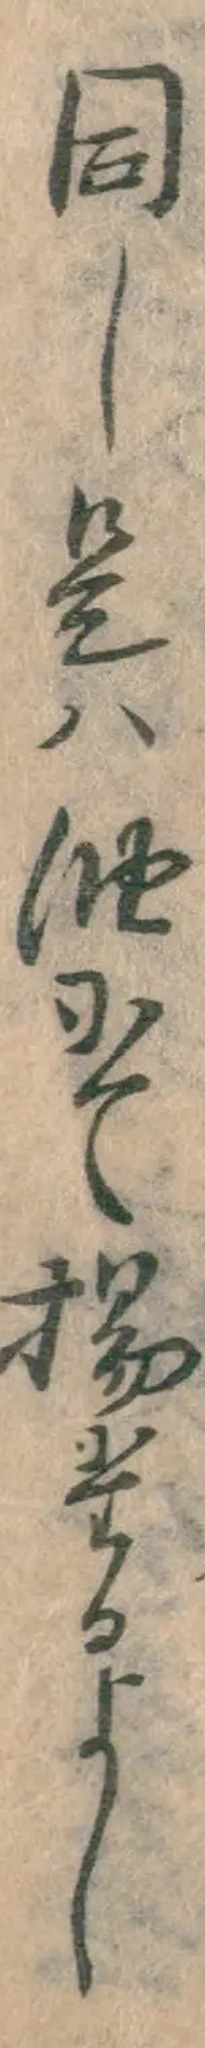同し是は油にて揚たるよし
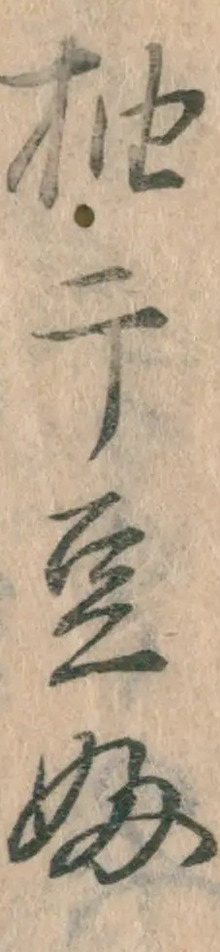柚干豆ふ
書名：豆腐百珍余録
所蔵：国立国会図書館 National Diet Library, JAPAN
